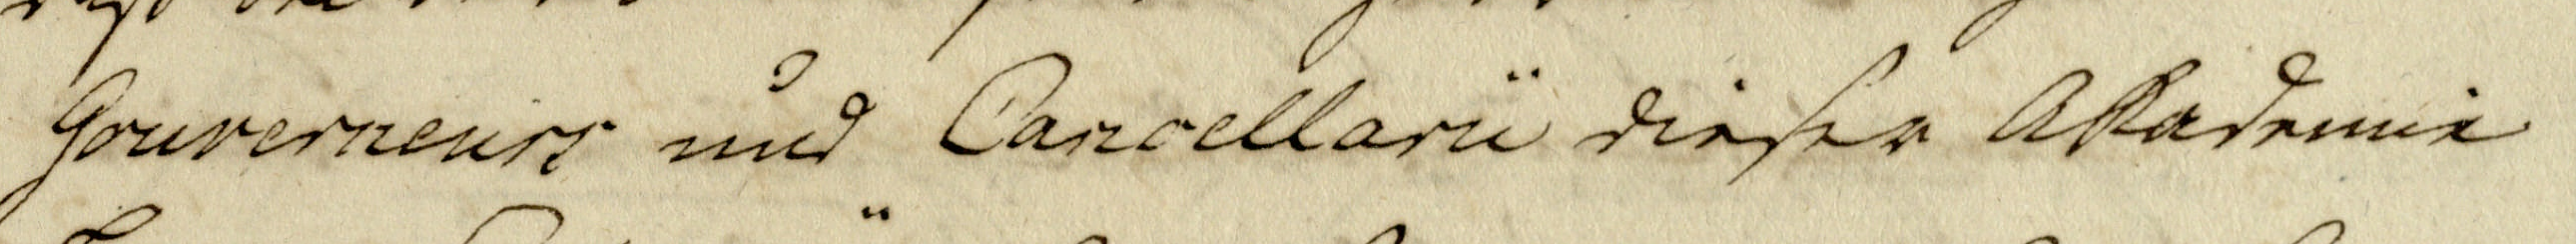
Gouverneurs und Cancellarii dieser Akademie
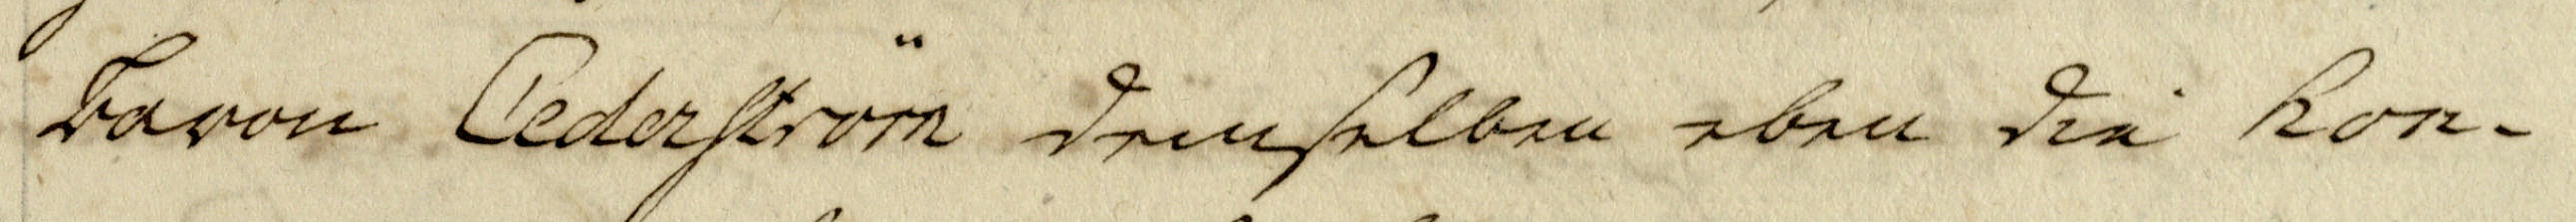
Baron Cederström demselben eben die hon¬
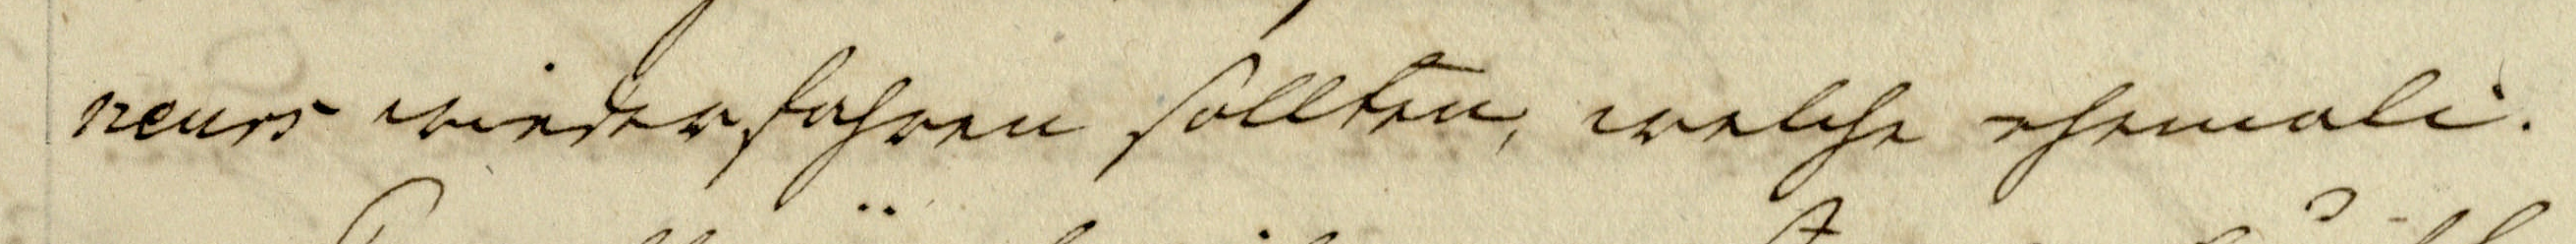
neurs wiederfahren sollten, welche ehemali¬
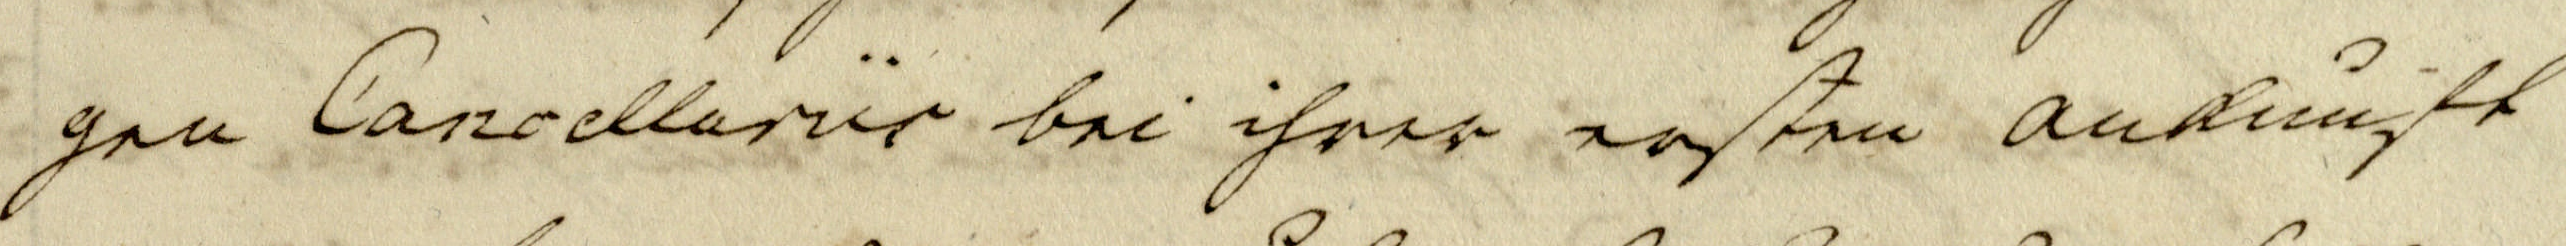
gen Cancellariis bei ihrer ersten Ankunft
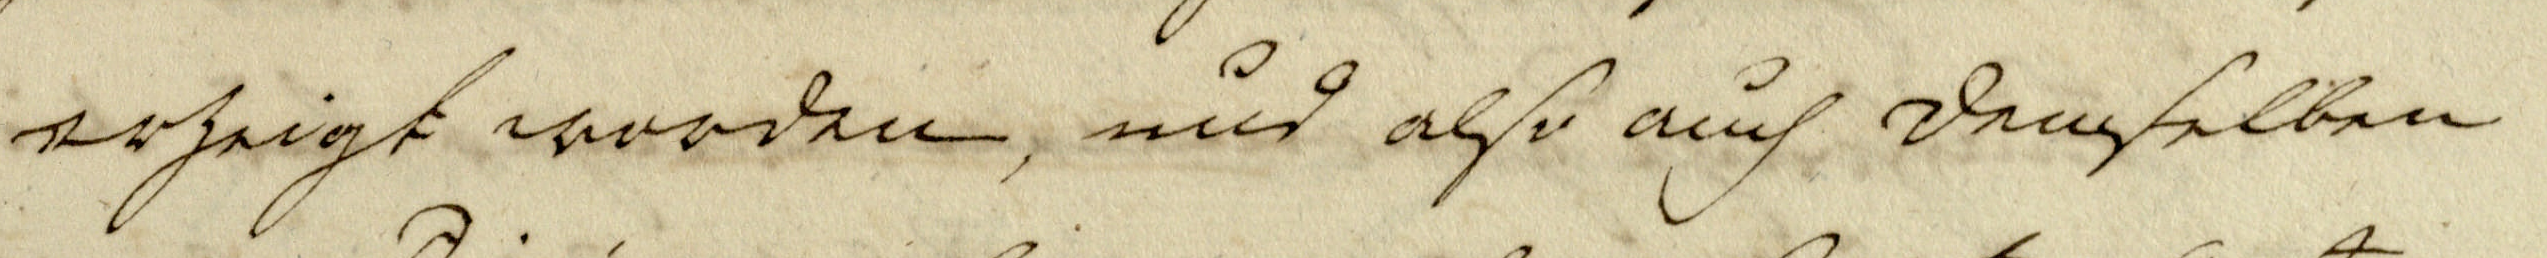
erzeigt worden, und also auch Demselben
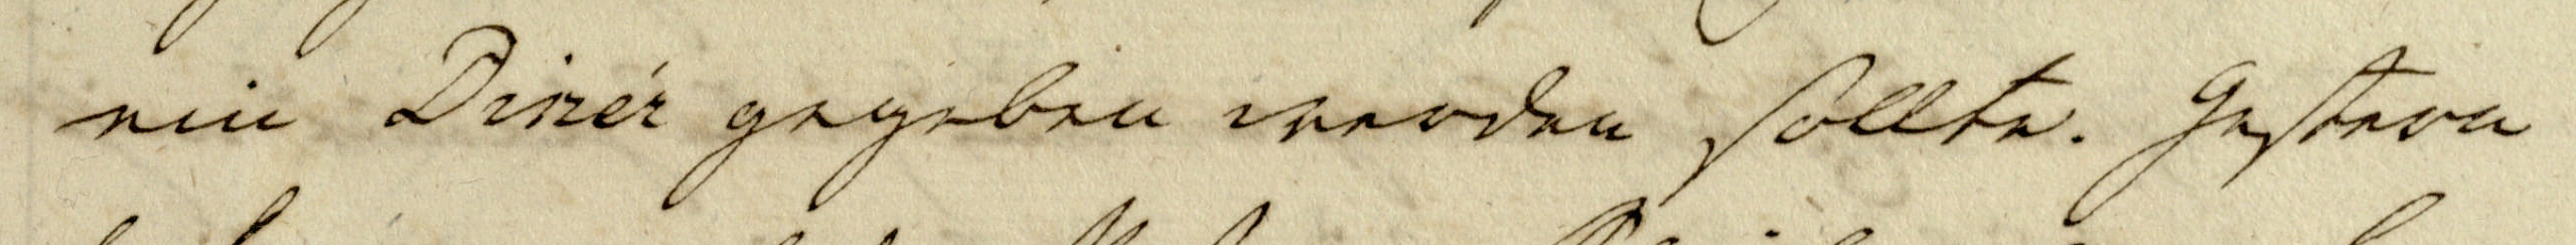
ein Dinér gegeben werden sollte. Gestern
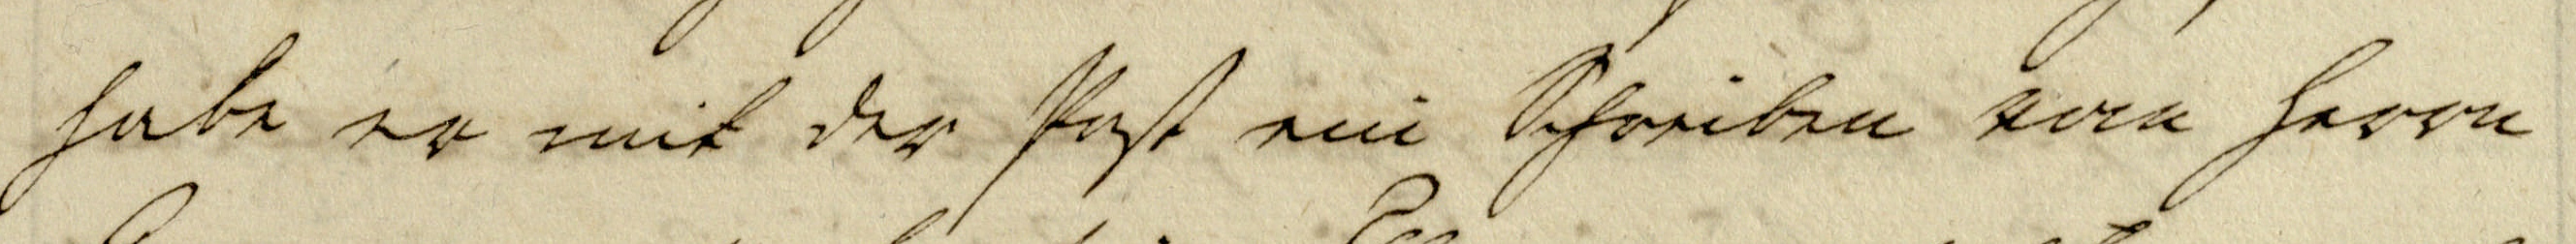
habe er mit der Post ein Schreiben vom Herrn
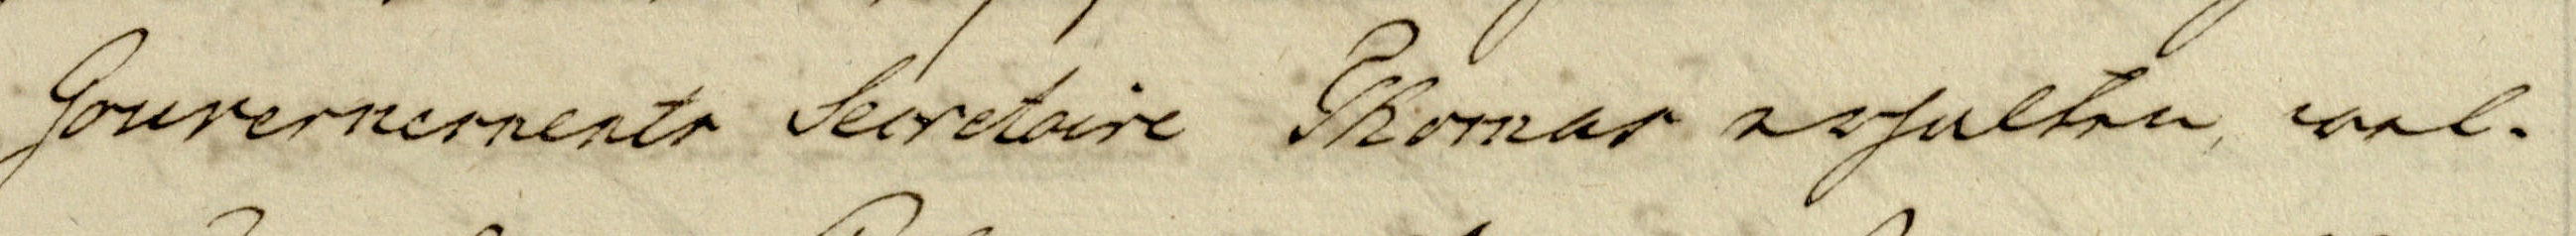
Gouvernements Secretaire Thomas erhalten, wel-
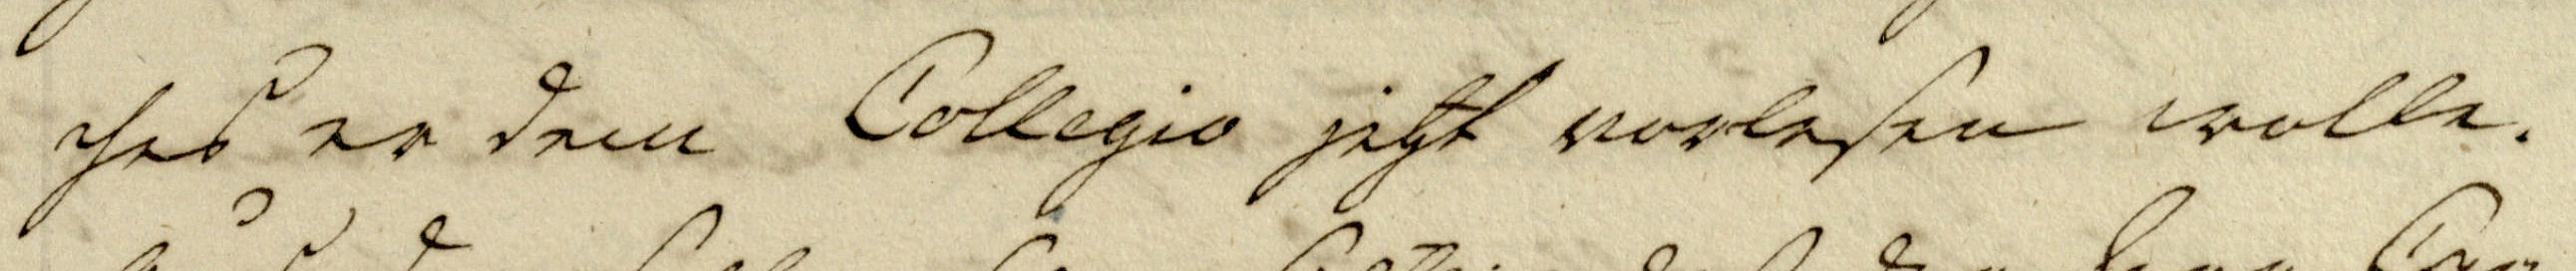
ches er dem Collegio jetzt vorlesen wolle.
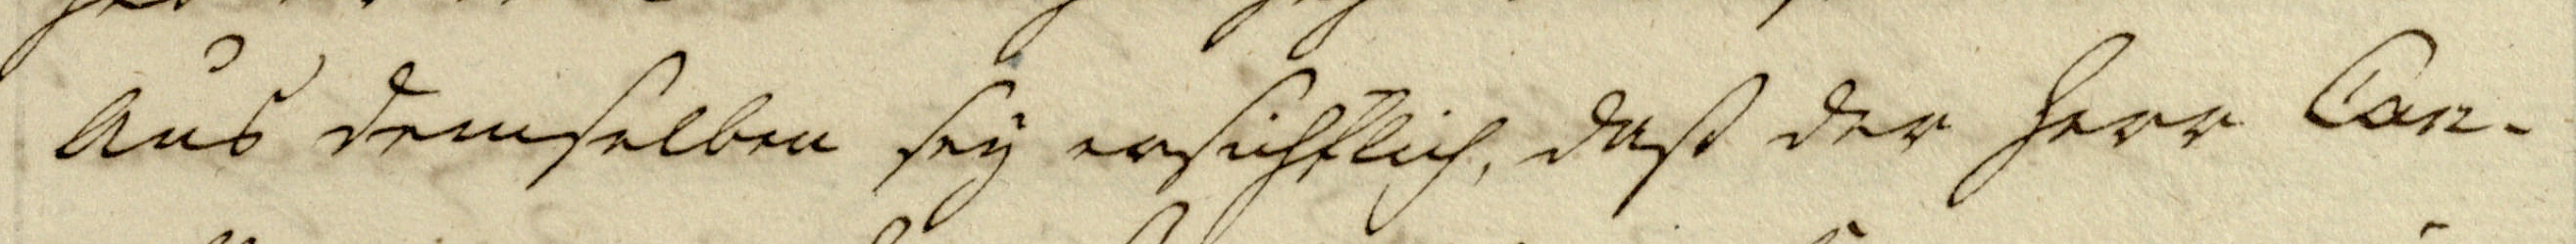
Aus demselben seÿ ersichtlich, daß der Herr Can¬
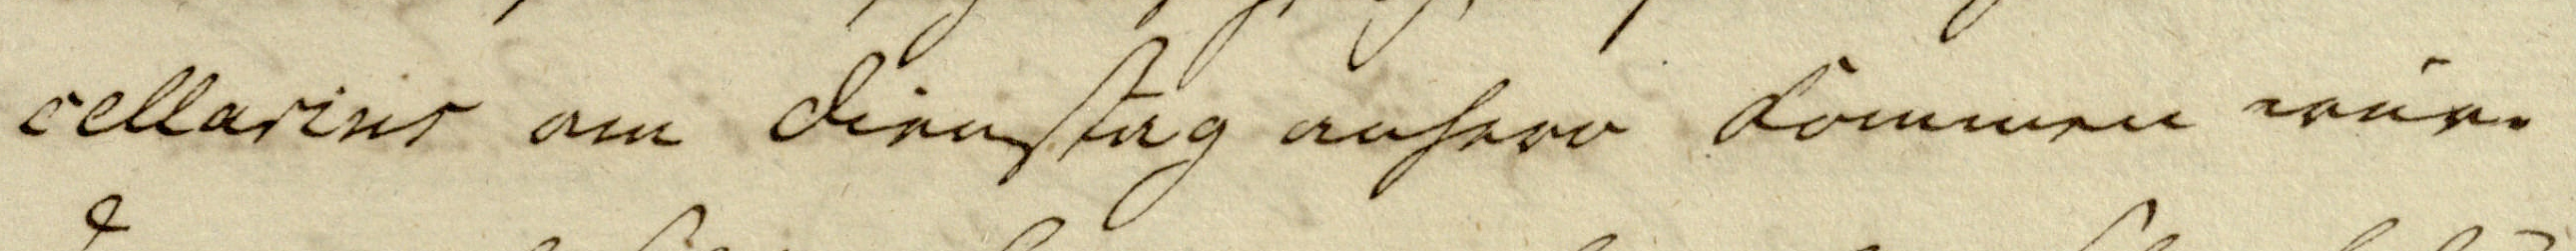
cellarius am Dienstag anhero kommen wür¬
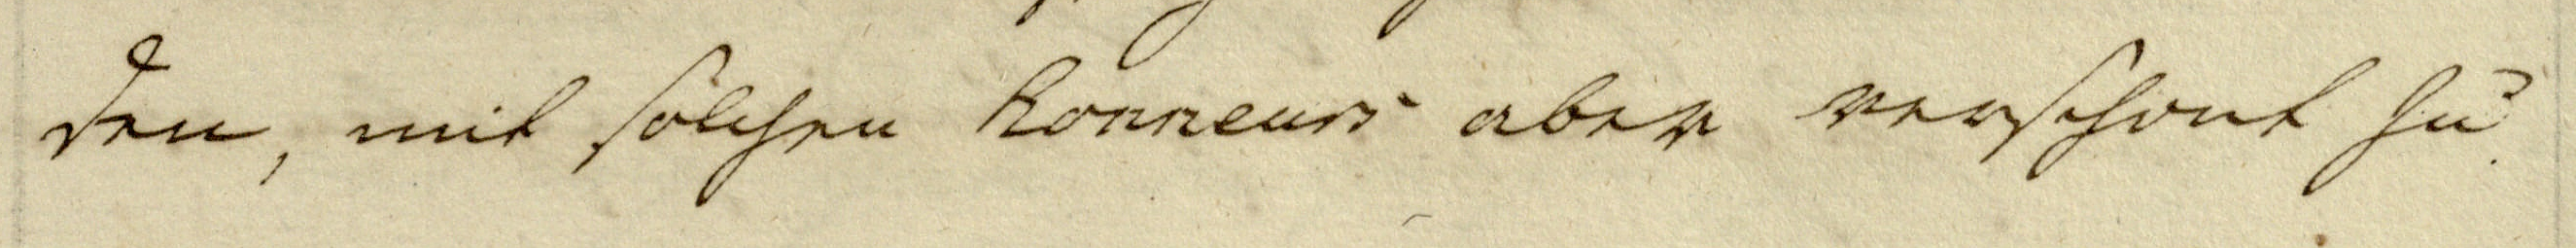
den, mit solchen honneurs aber verschont zu
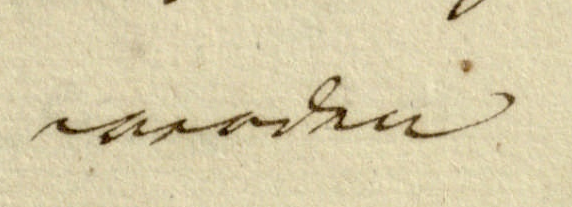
werden
